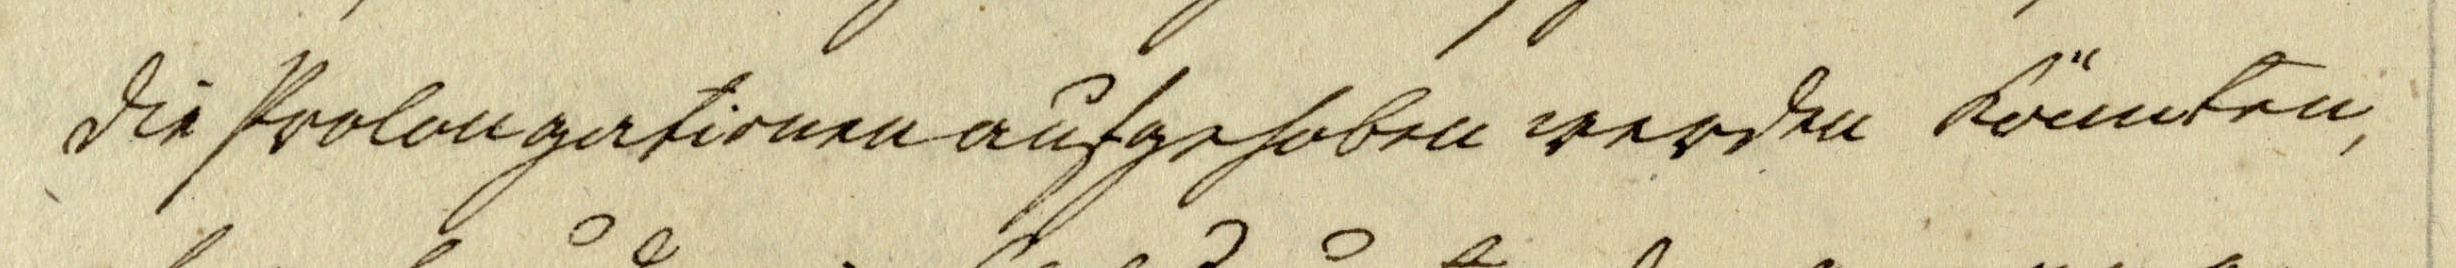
die Prolongationen aufgehoben werden könnten,
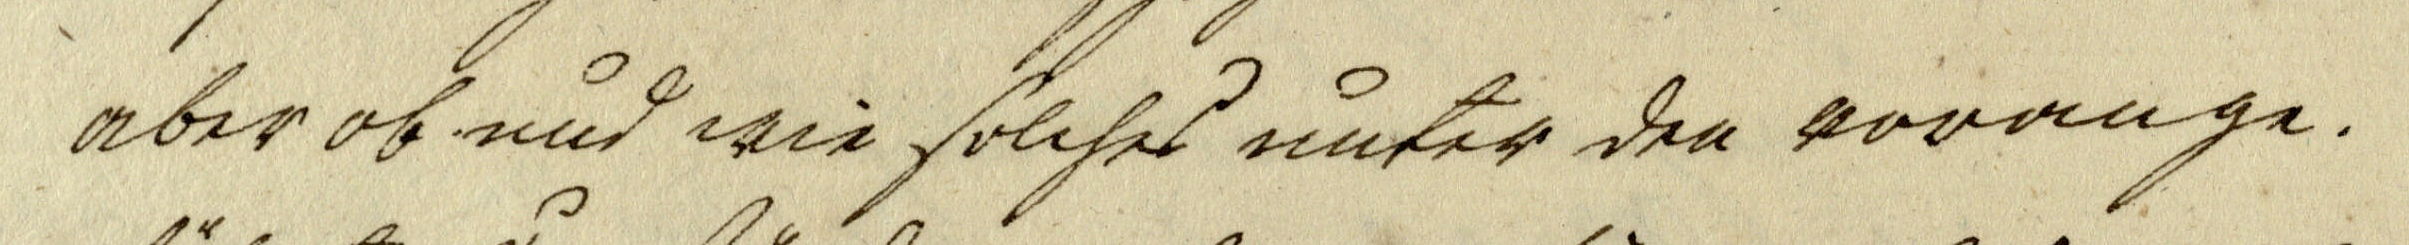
aber ob und wie solches unter den vorange¬
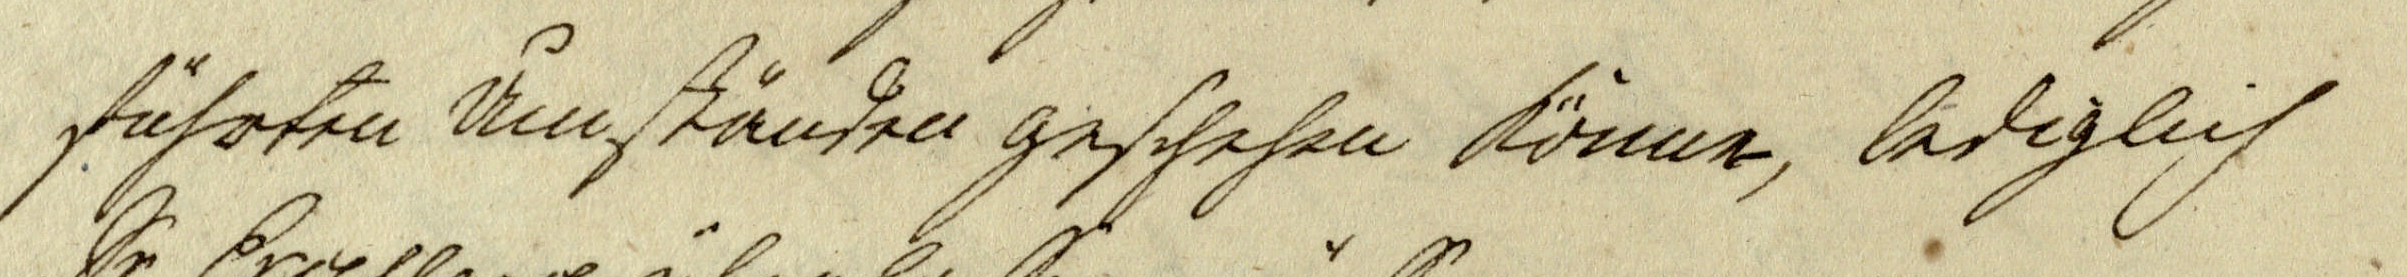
führten Umständen geschehen könne, lediglich
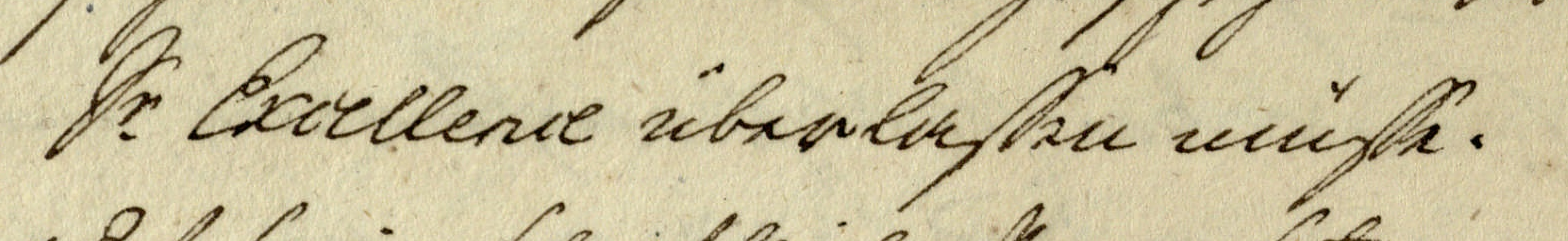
Sr Excellence überlassen müsse.
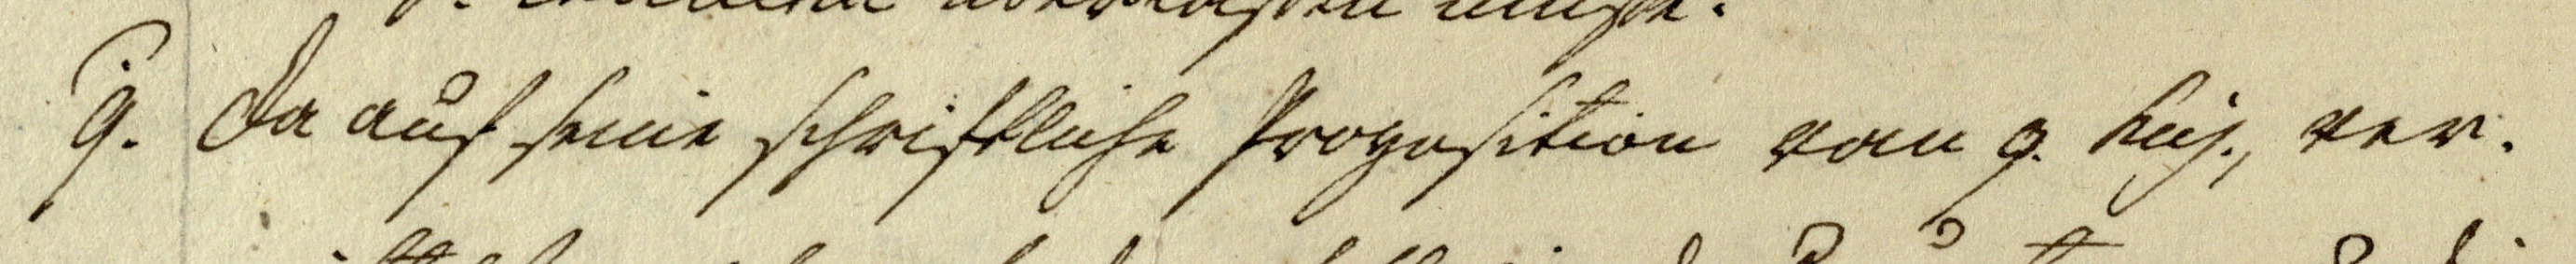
9. Da auf seine schriftliche Proposition vom 9. huj., ver¬
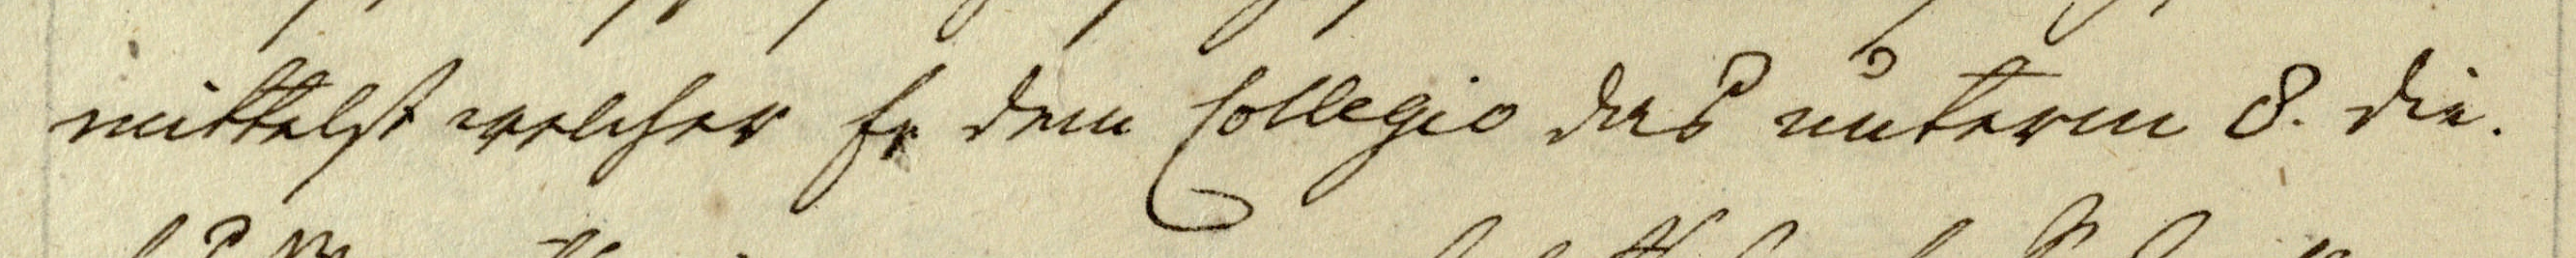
mittelst welcher Er dem Collegio das unterm 8. die¬
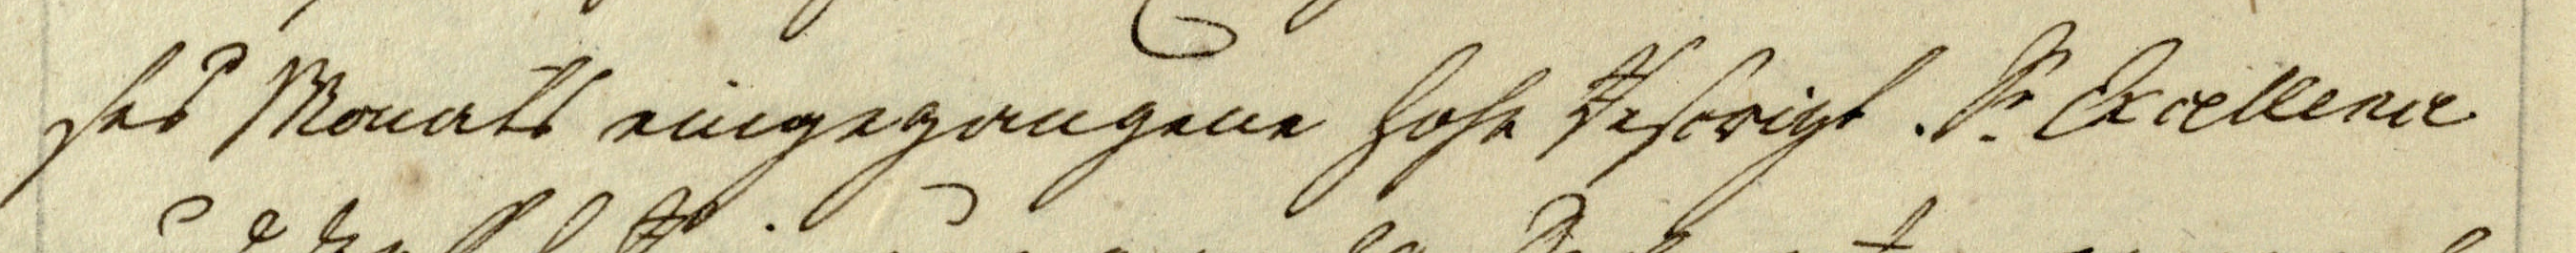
ses Monats eingegangene hohe Rescript Sr. Excellence
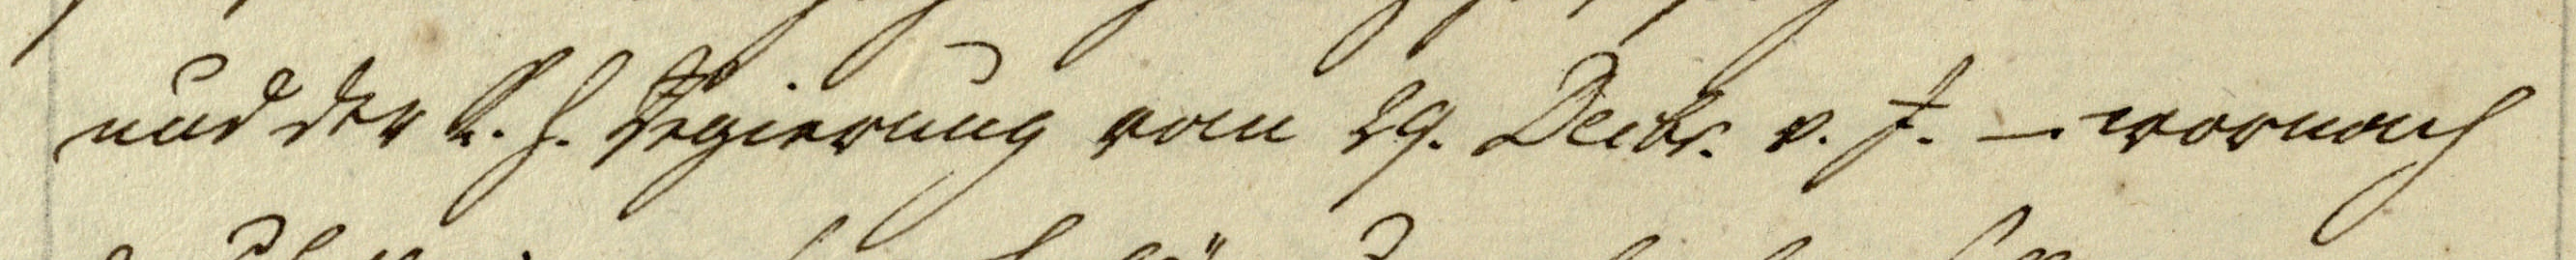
und der K. H. Regierung vom 29. Decbr. v. J. wornach
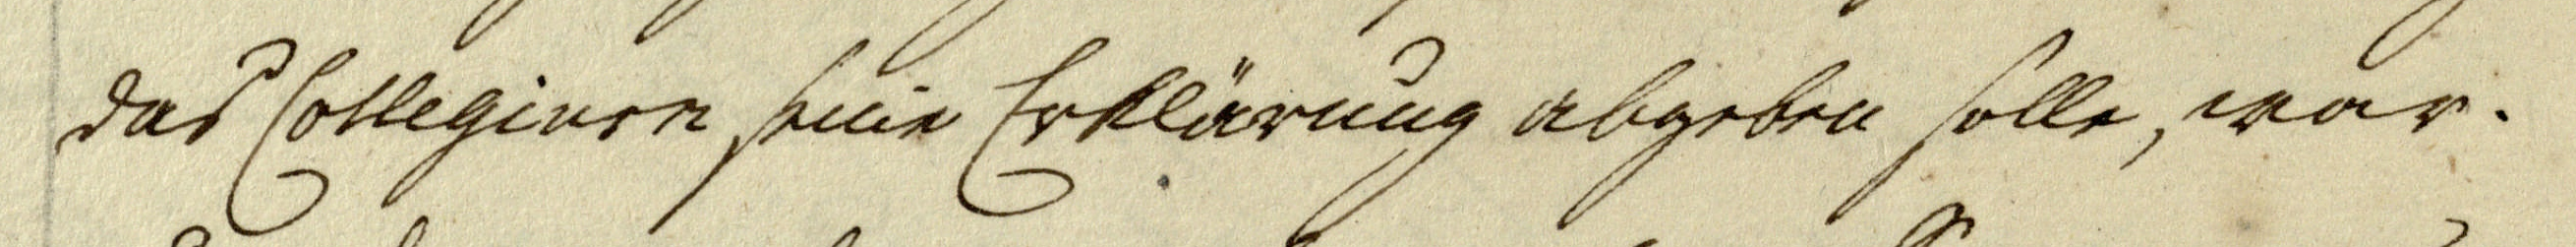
das Collegium seine Erklärung abgeben solle, war¬
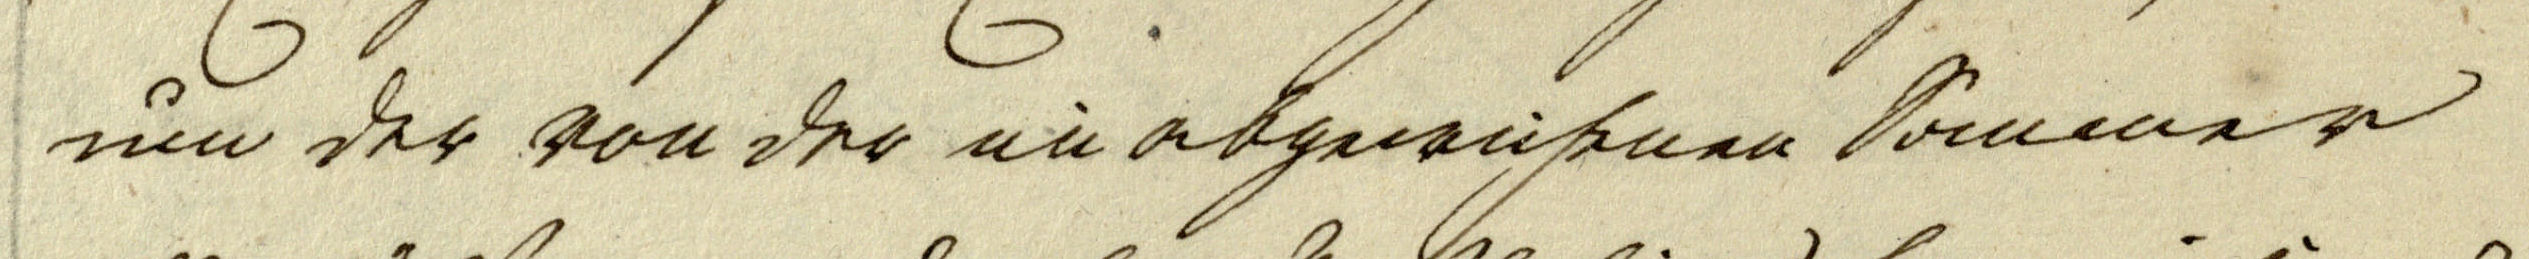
um der von der im abgewichenen Sommer
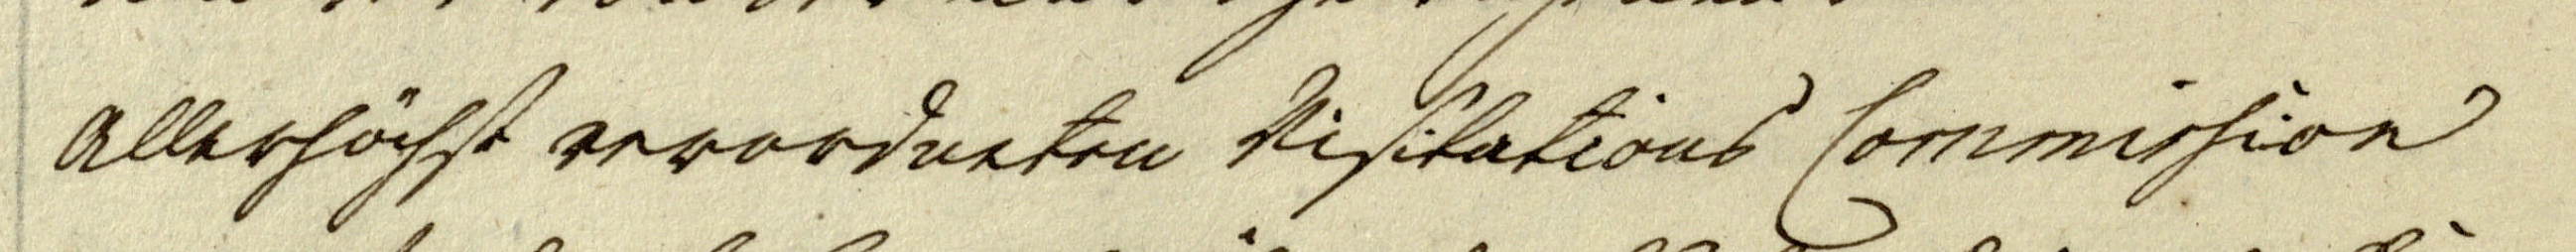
allerhöchst verordneten Visitations Commission
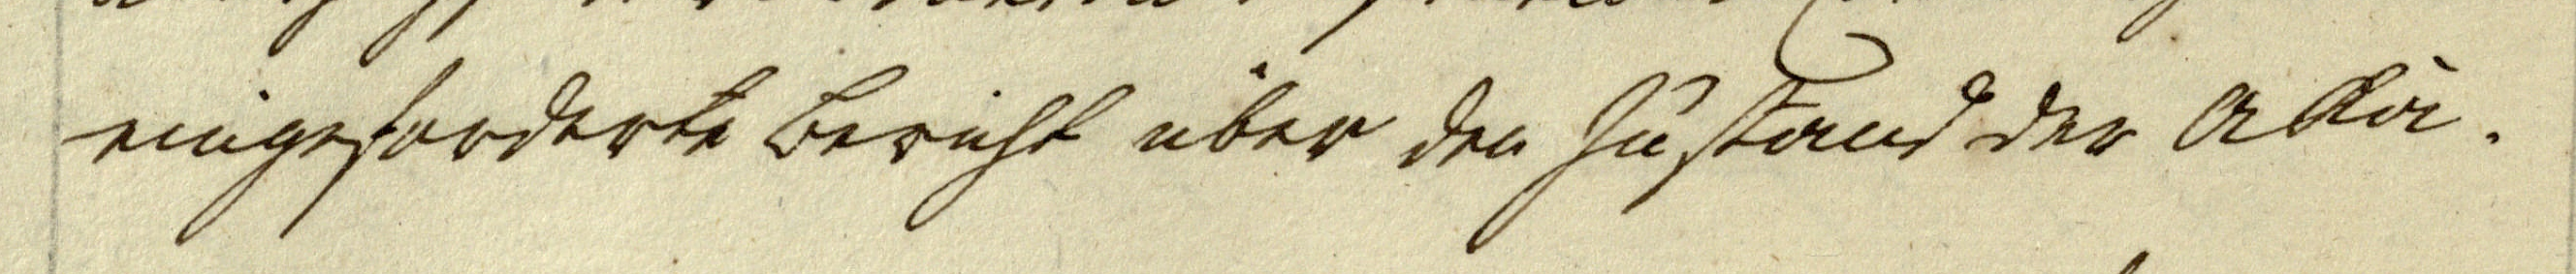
eingeforderte Bericht über den Zustand der Aka¬
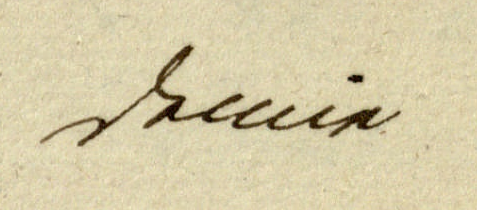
demie
